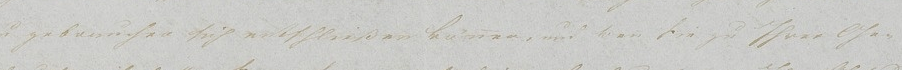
zu gebrauchen sich entschließen können, und wenn Sie zu Ihrer Ge-
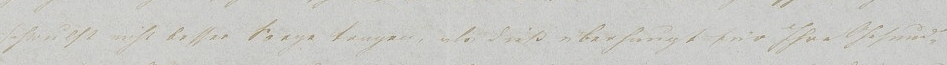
schwulst nicht besser Sorge tragen, als dieß überhaupt für Ihre Gesund-
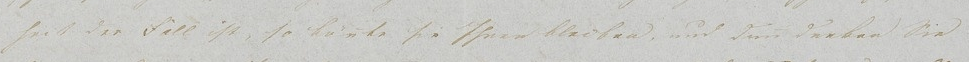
heit der Fall ist, so könnte sie Ihnen bleiben, und dann denken Sie
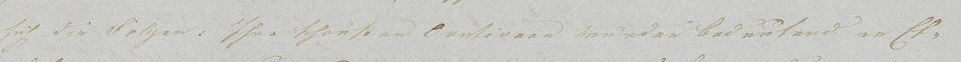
sich die Folgen: Ihre schönsten Orationen würden bedeutend an Ef-
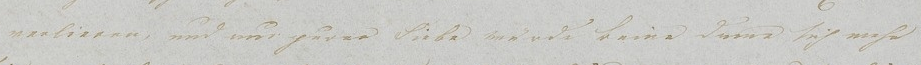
verlieren, und aus purer Liebe würde keine Dame sich mehr
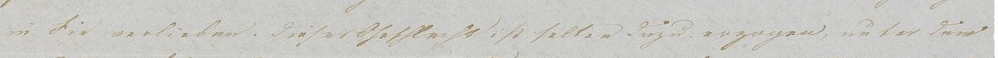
in Sie verlieben. Dieses Geschlecht ist selten dazu erzogen, unter dem
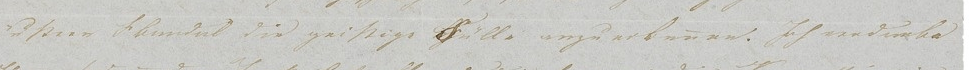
äußern Skandal die geistige HFülle anzuerkennen. Ich verdanke
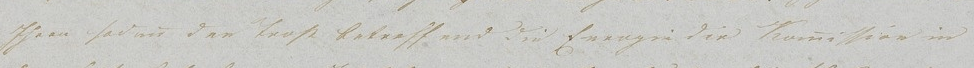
Ihnen sodann den Trost betreffend die Energie der Kommission in
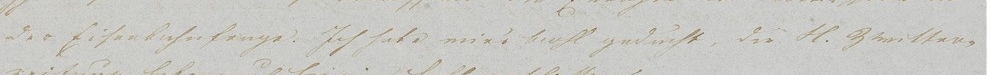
der Eisenbahnfrage. Ich habe mir's wohl gedacht, die N. Zwitter-
